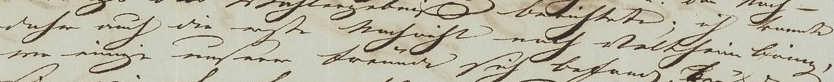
daher auch die erste Nachricht nach Veltheim bringen,
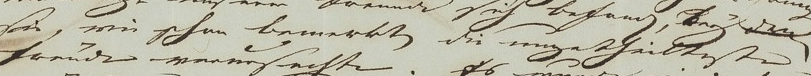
sie, wie schon bemerkt, die ungetheilteste
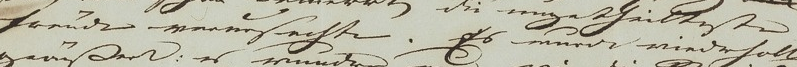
Freude verursachte. Es wurde wiederholt
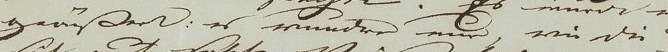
geäußert: es wundre nur, wie die
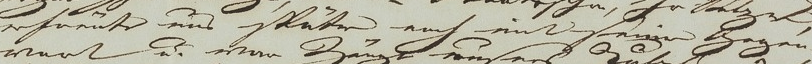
erfreute uns später noch mit seiner Gegen-
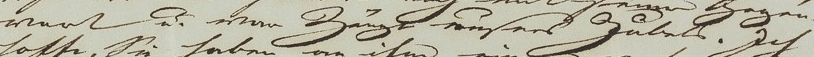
wart u. war Zeuge unsers Jubels. Ich
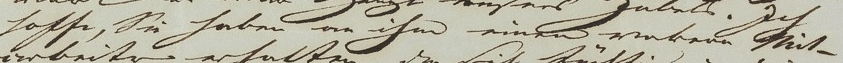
hoffe, Sie haben an ihm einen wakern Mit-
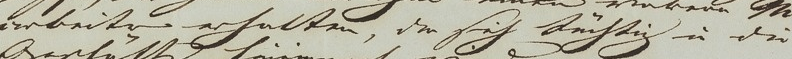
arbeiter erhalten, der sich tüchtig in die
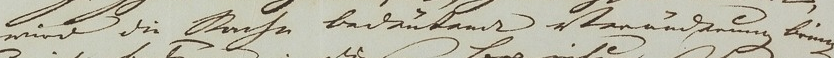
wird die Sache bedeutende Veränderungen bringen
